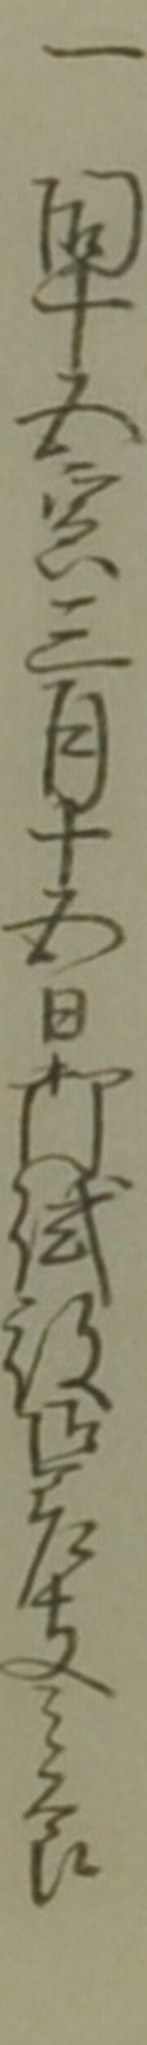一同十五寅三月十五日御試役御差支之節
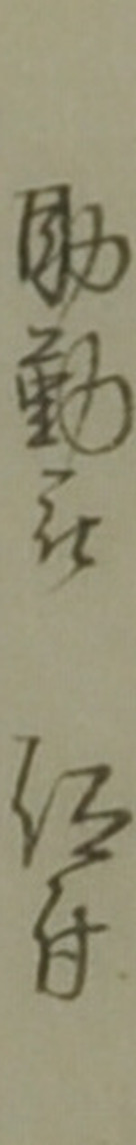助勤被仰付
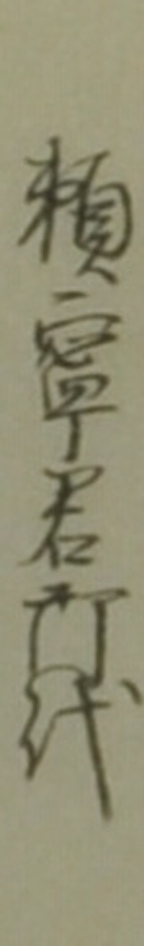頼寧君御代
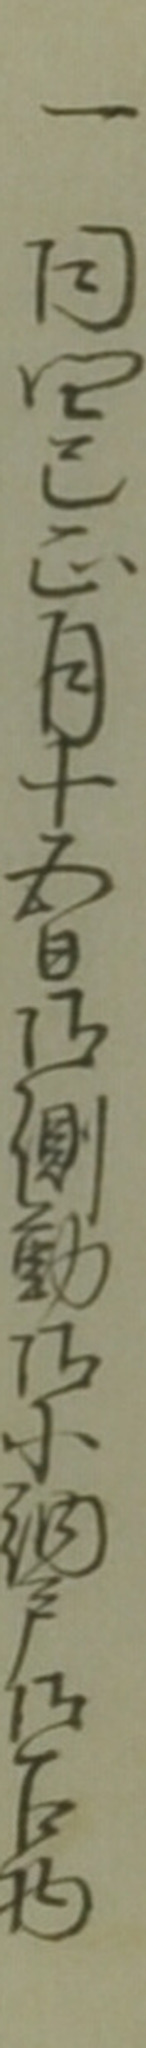一同四巳正月十五日御側勤御小納戸御召物
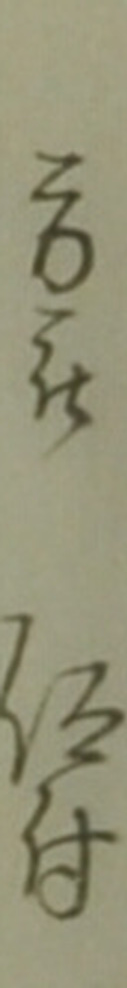方被仰付
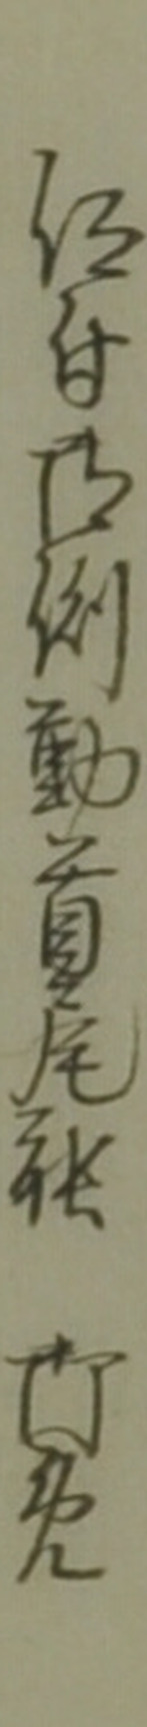仰付御側勤首尾能御免
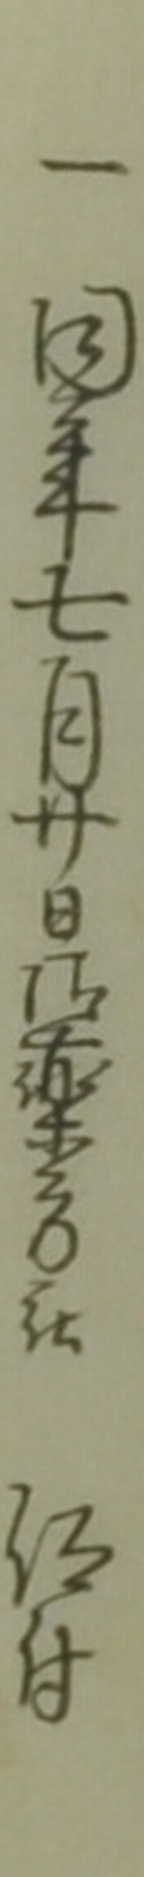一同年七月廿日御薬方被仰付
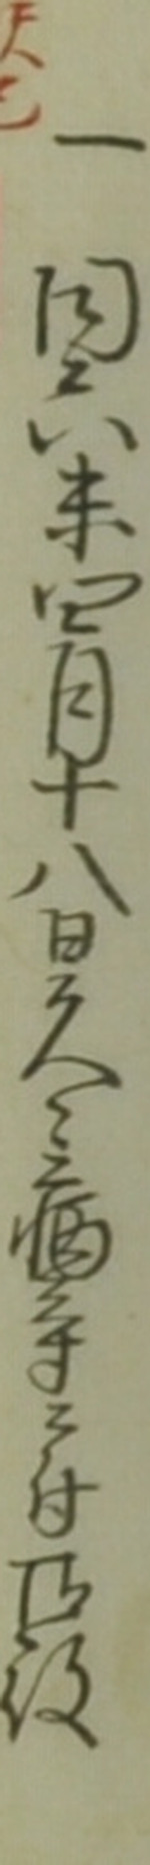一同六月未四月十八日久々病気ニ付御役

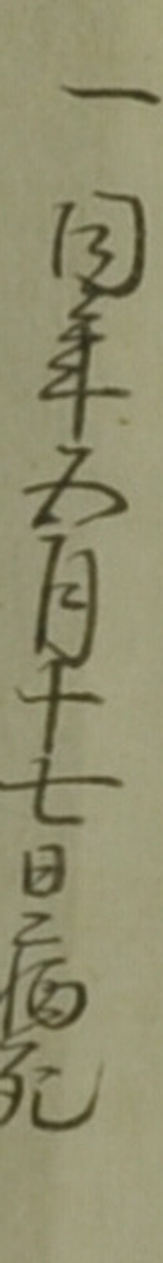一同年五月十七日病死
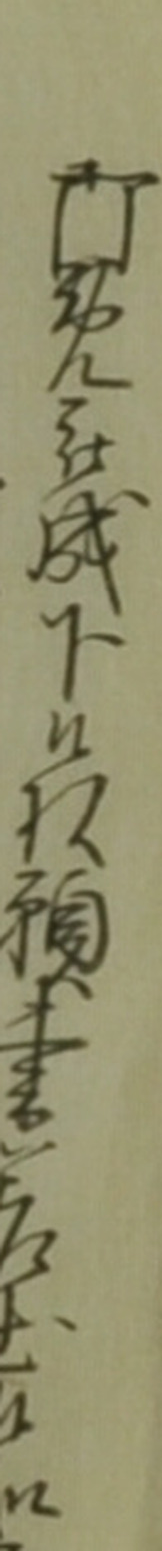御免被成下候相願書差出候処御差留
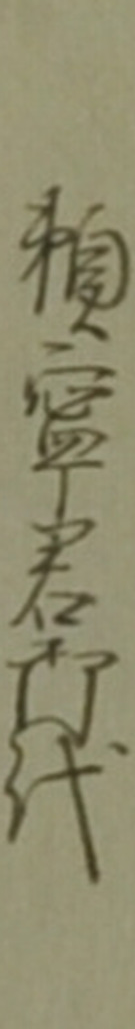頼寧君御代
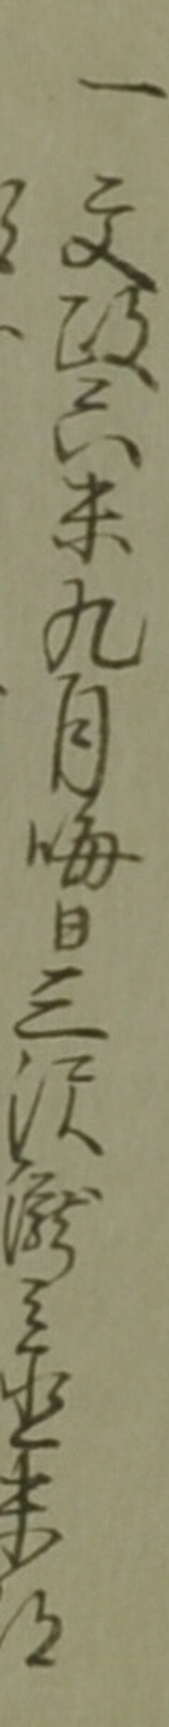一文政六未九月晦日三沢瀧之丞末期
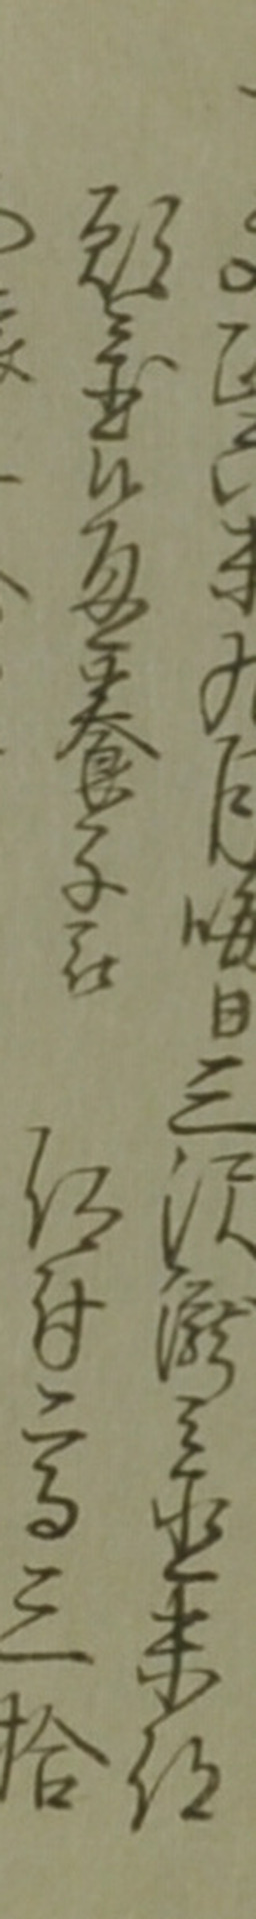願置候通養子被仰付高三拾
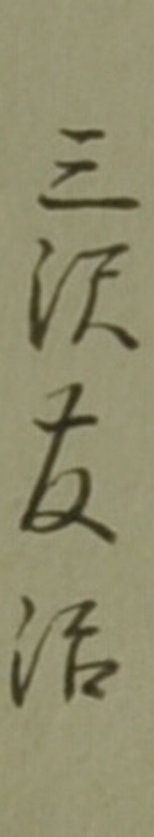三沢友治
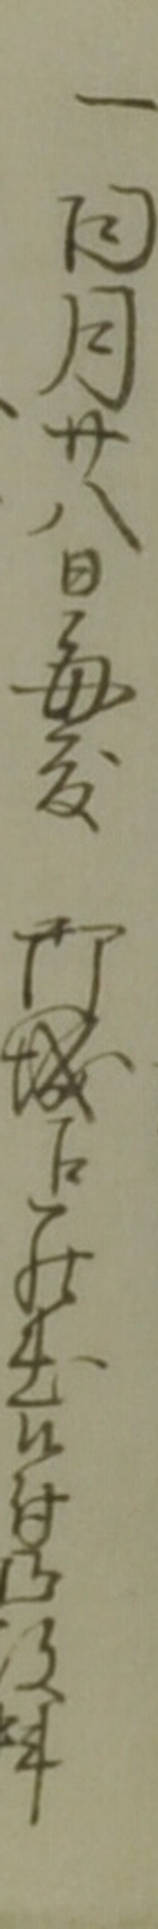一同月廿八日毎度御城江罷出候付御役料
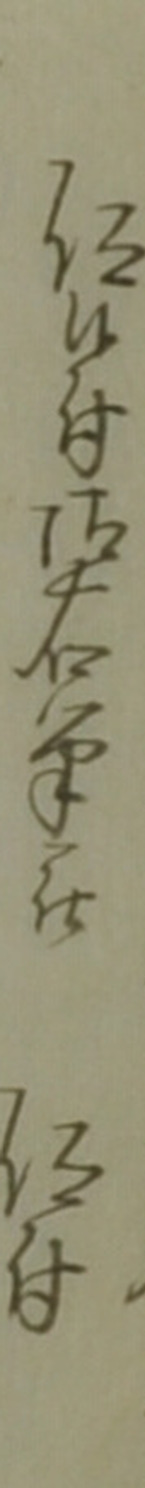仰候付御右筆被仰付
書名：給人諸士勤仕録（三）
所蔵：伊那市立高遠町図書館・合同会社AMANE
